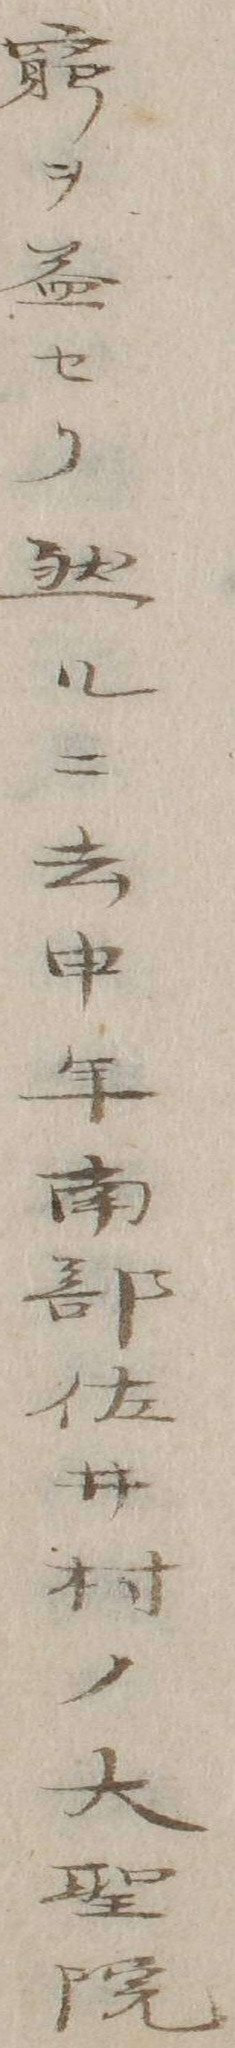窮ヲ益セリ然ルニ去申年南部佐井村ノ大聖院

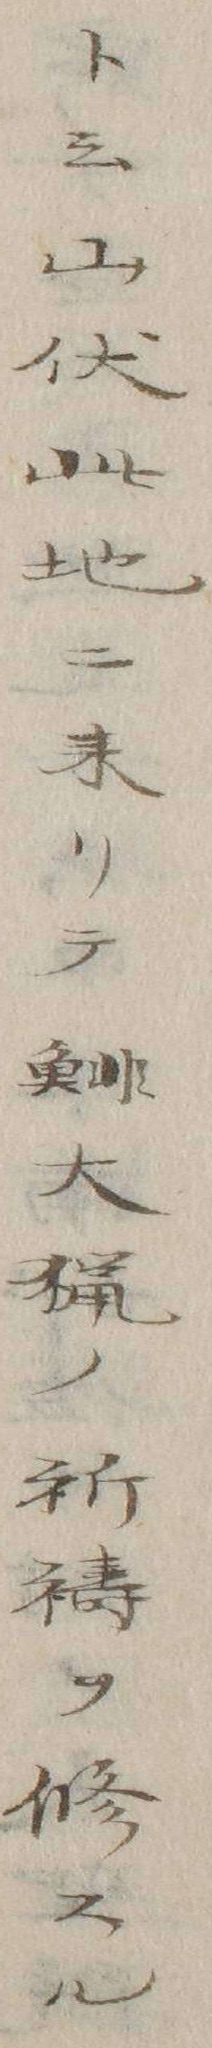ト云山伏此地ニ来リテ鯡大猟ノ祈祷ヲ修スル
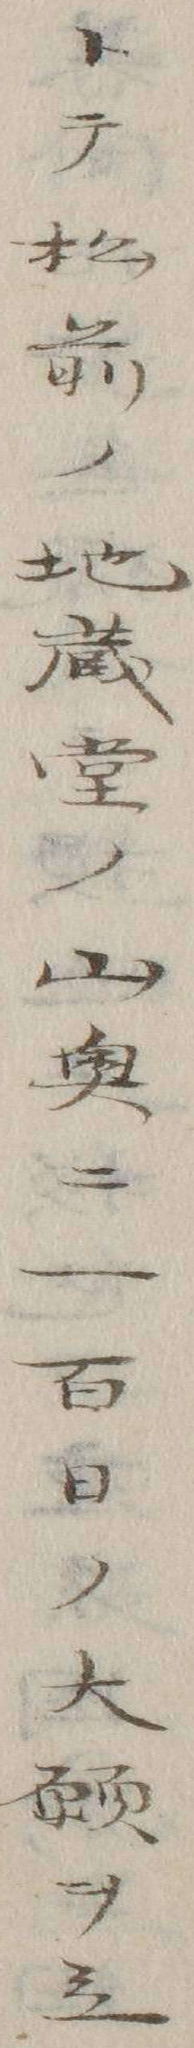トテ松前ノ地蔵堂ノ山奥ニ一百日ノ大願ヲ立
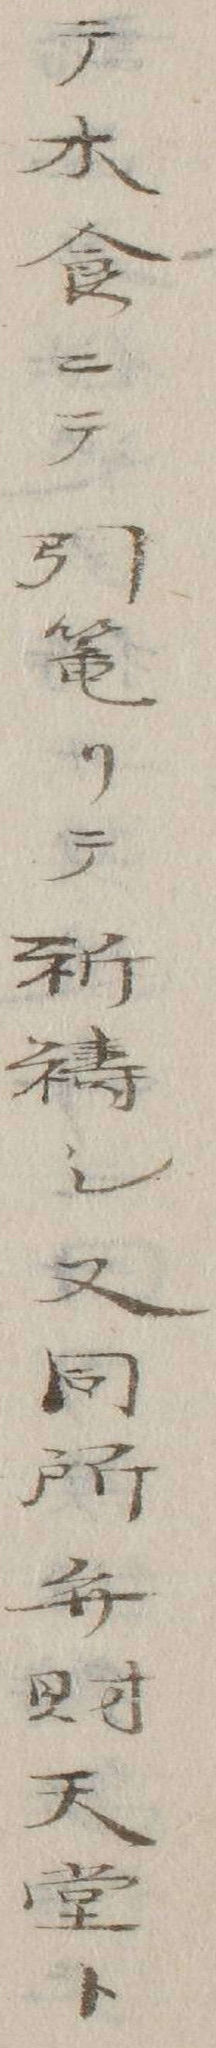テ木食ニテ引籠リテ祈祷シ又同所弁財天堂ト
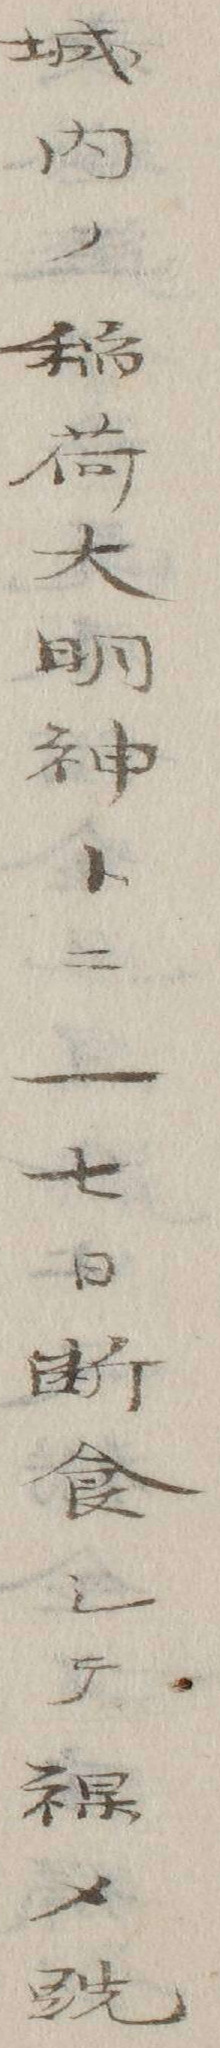城内ノ稲荷大明神トニ一七日断食シテ裸メ跣
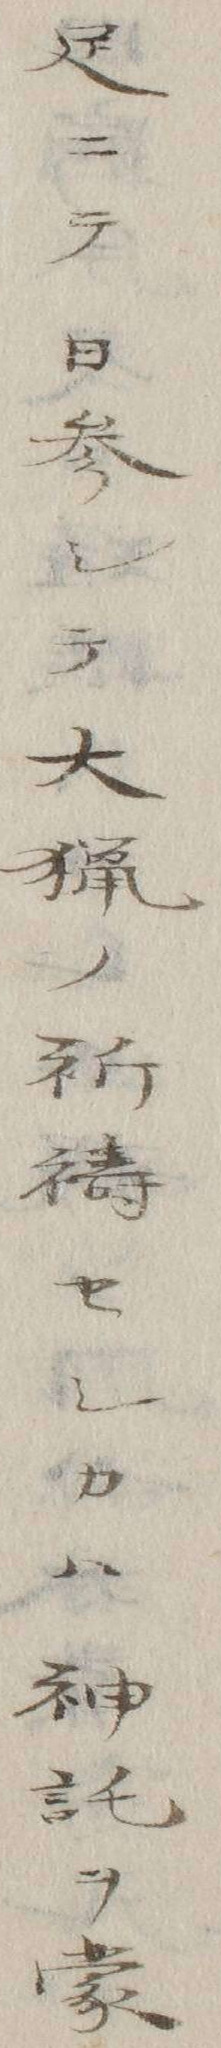足ニテ日参シテ大猟ノ祈祷セシカハ神託ヲ蒙
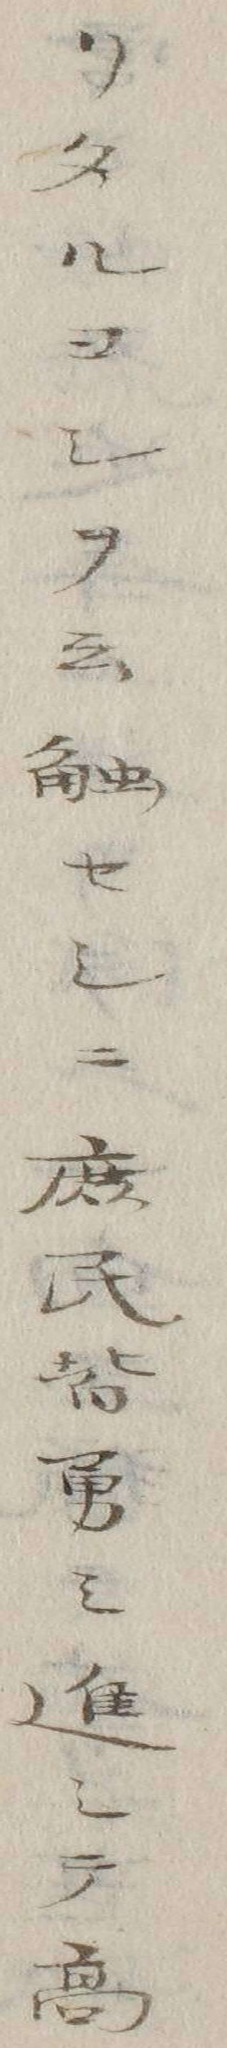リタルヨシヲ云触セシニ庶民皆勇ミ進ミテ高
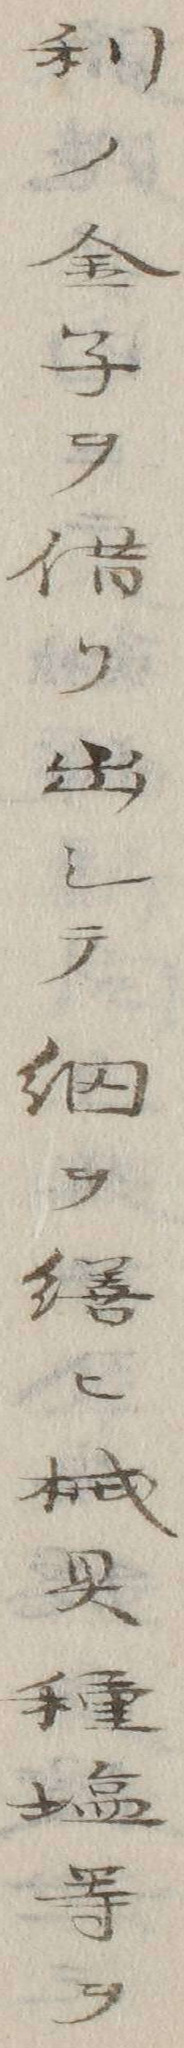利ノ金子ヲ借リ出シテ細ヲ繕ヒ械具種塩等ヲ
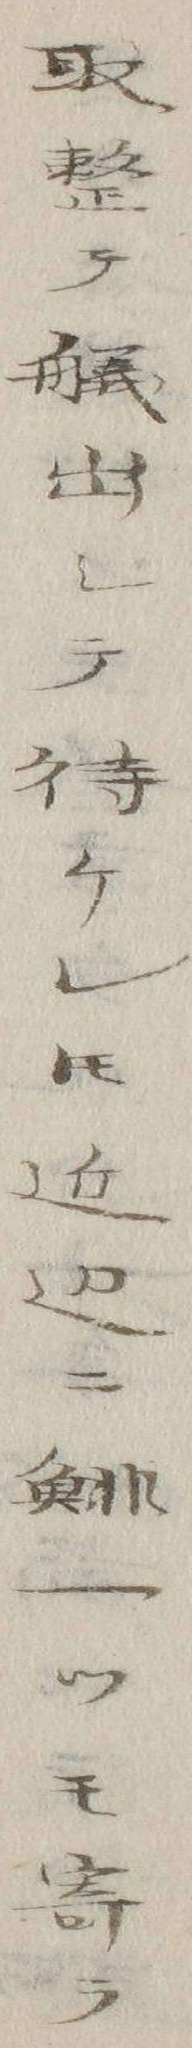取整テ艤出シテ待ケレ𪜈近辺ニ鯡一ツモ寄ラ
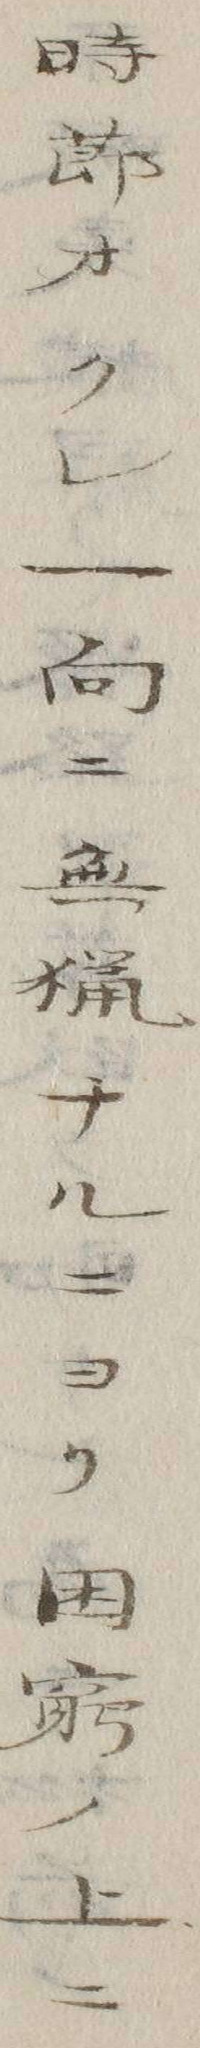時節オクレ一向ニ無猟ナルニヨリ困窮ノ上ニ
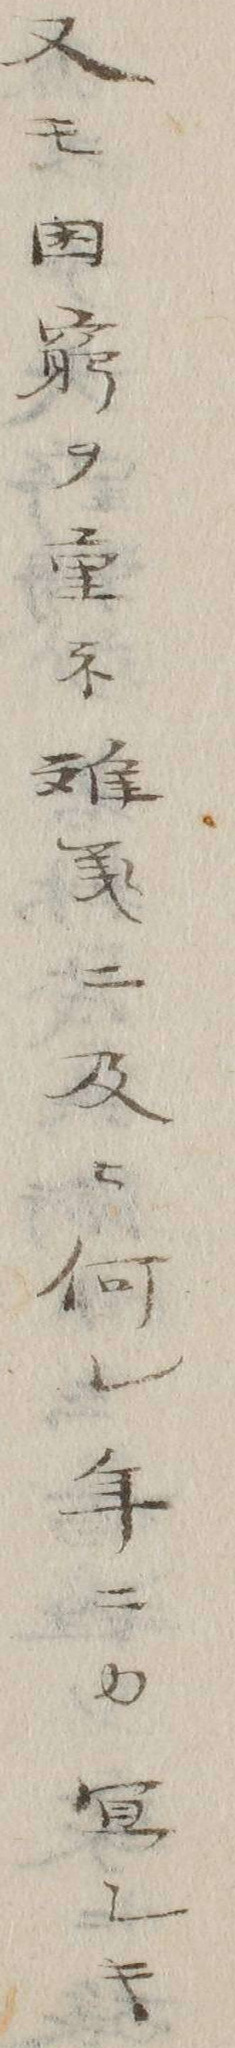又モ困窮ヲ重ネ難義ニ及ヒ何レ年ニカ宜シキ
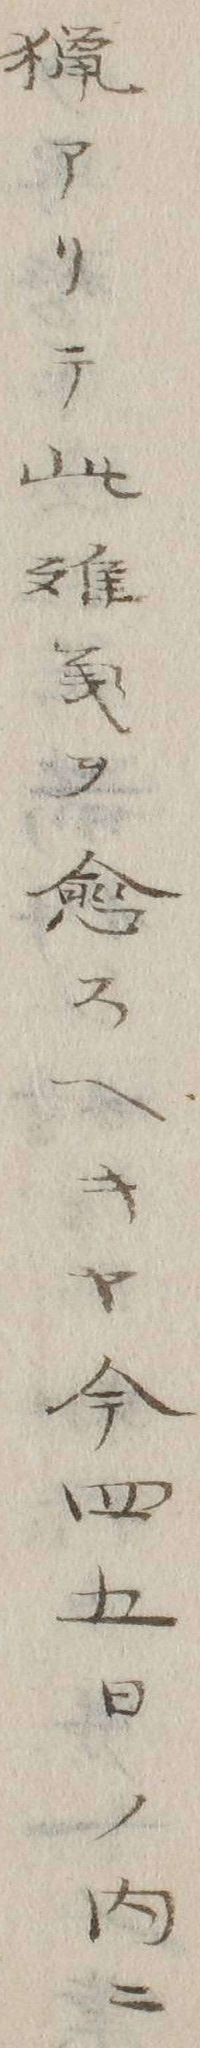猟アリテ此難義ヲ愈スヘキヤ今四五日ノ内ニ
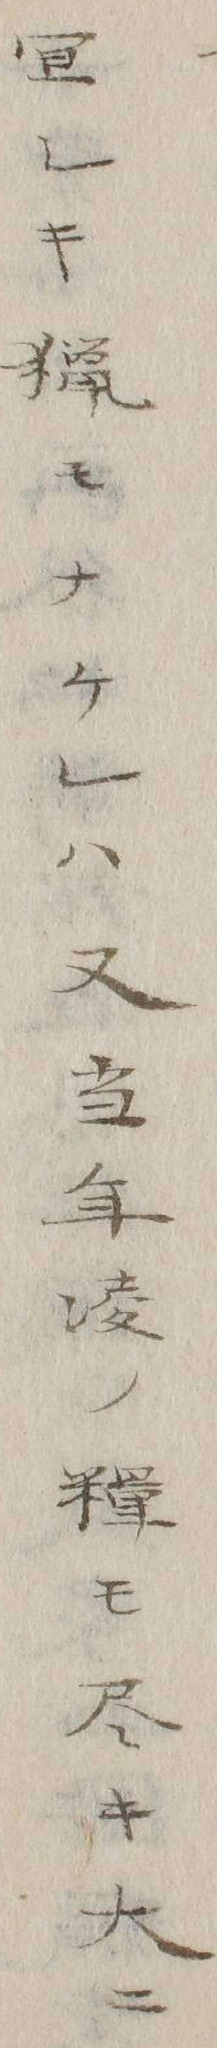宜シキ猟モナケレハ又当年凌ノ糧モ尽キ大ニ
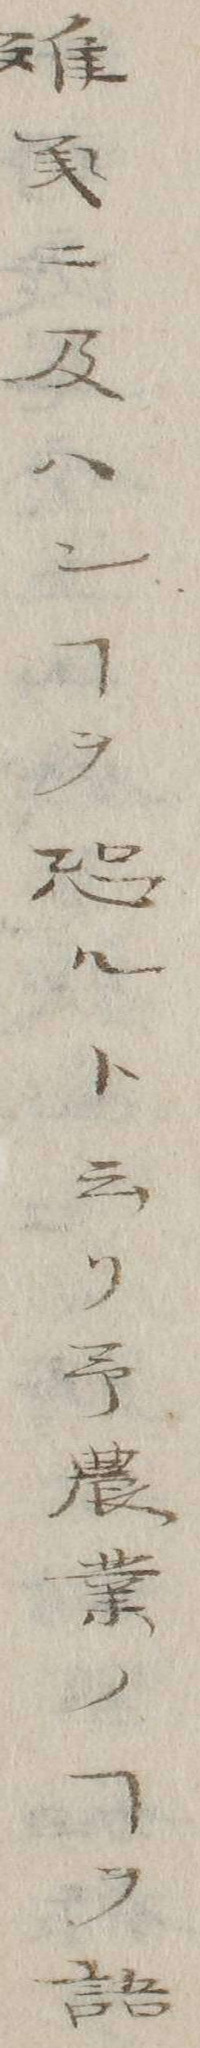難義ニ及ハンヿヲ恕ルト云リ予農業ノヿヲ語
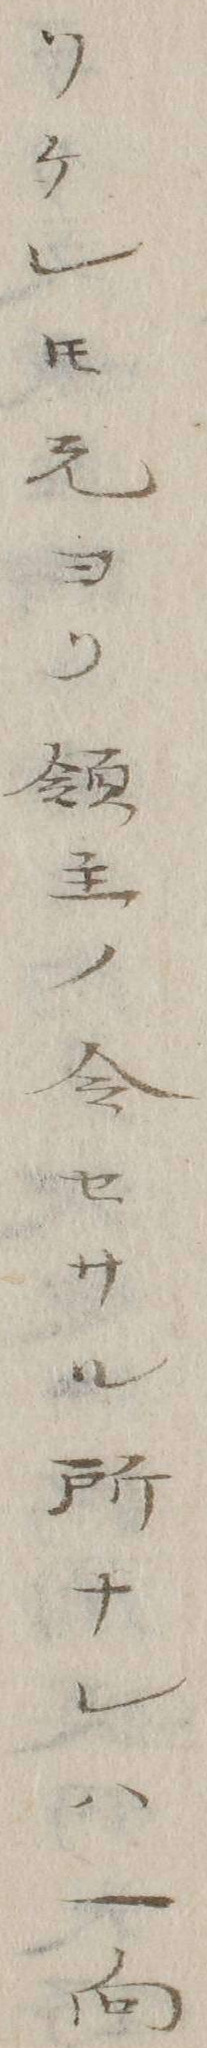リケレ𪜈元ヨリ領主ノ令セサル所ナレハ一向
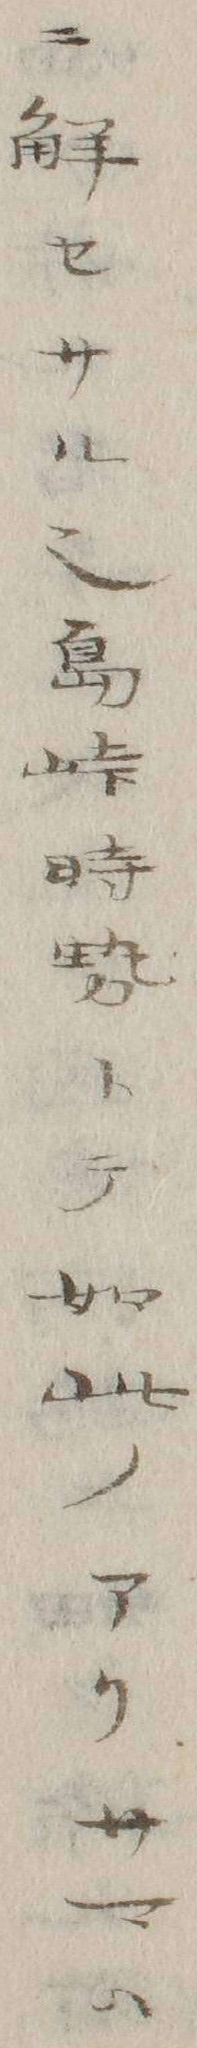ニ鮮セサル也島峠時勢トテ如此ノアリサマハ
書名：蝦夷草紙（国文学研究資料館）
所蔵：国文学研究資料館
